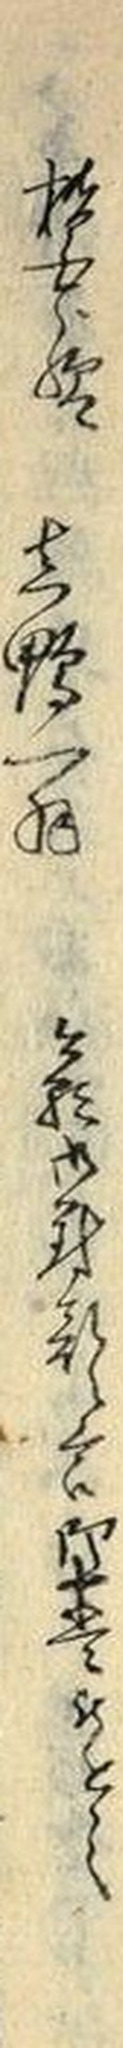揩五郎様へ真鴨一羽今朝御対顔候節御直々被進之
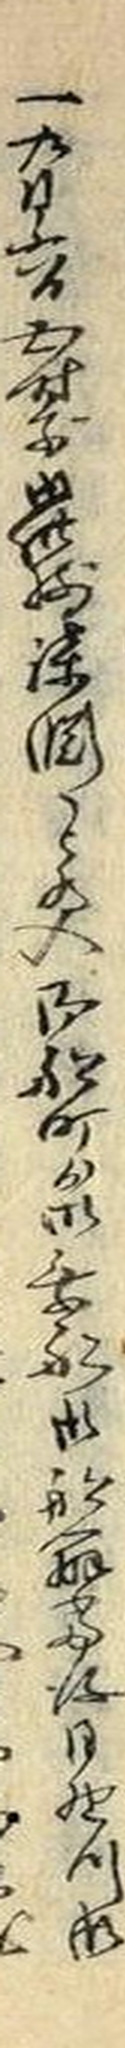一九月六日五時前御供揃漆渕へ被為入御船町ゟ御乗船御船弁当後日野川御
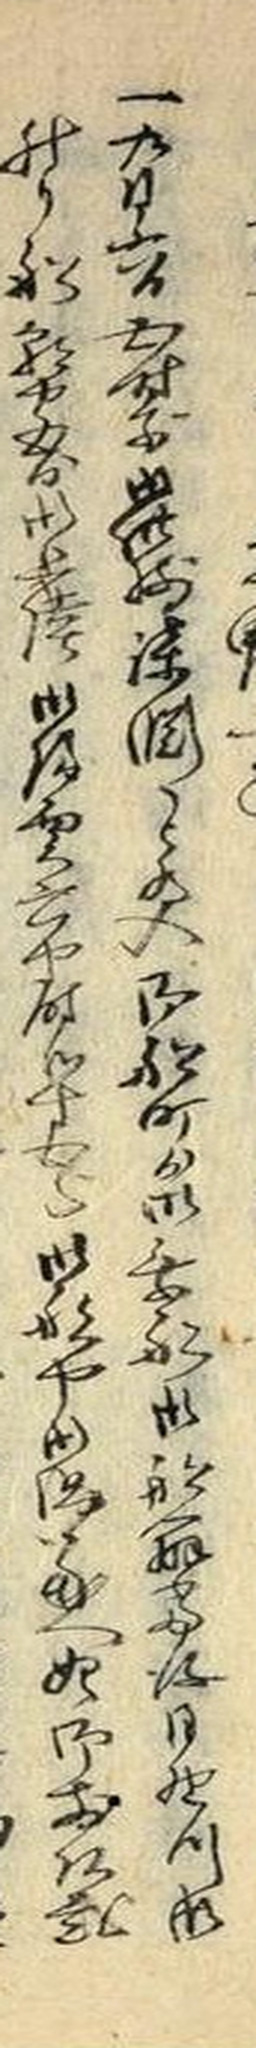升り船朝宮ゟ御上陸御帰殿六半時弐寸五分御船中御側御用人始御前頂戴
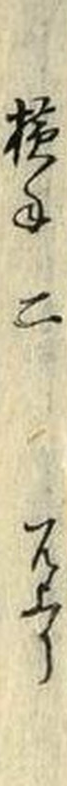横ね二召上り
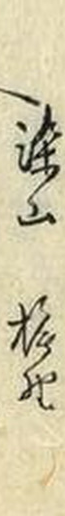染山梶野
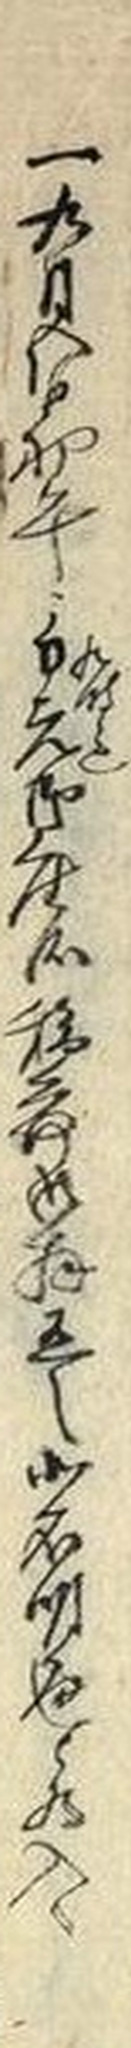一九月八日初午ニ付九時過元御座所稲荷御拝有之北不明通被為入候
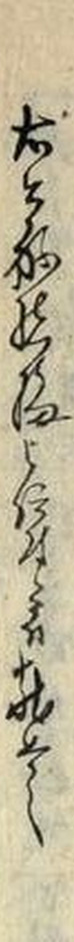右今般結構被仰付候ニ付献上之
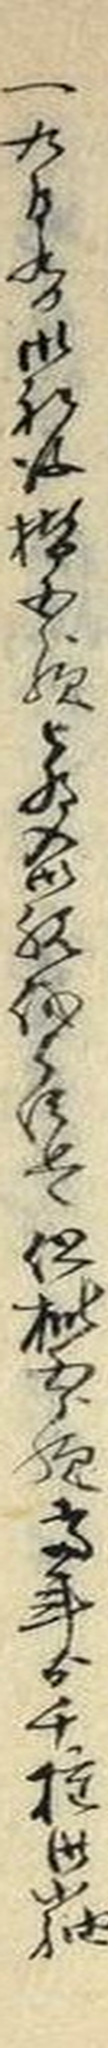一九月九日御膳後揩五郎様被為入御祝儀被仰上候但揩五郎様当年ゟ千種御小袖
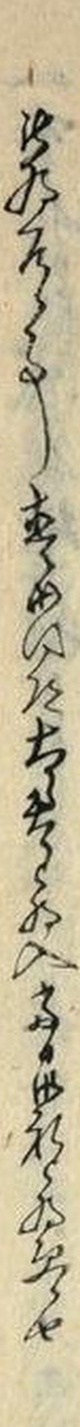被為召候事直ニ御同道大奥へ被為入当日御礼被為受候由

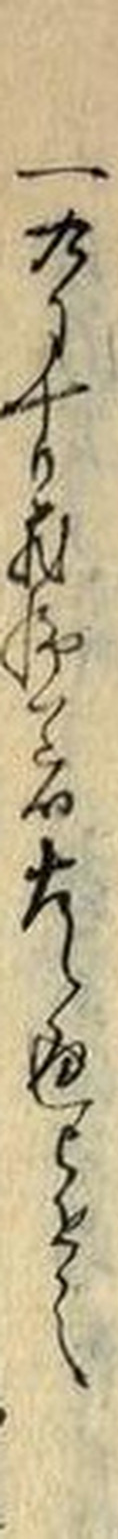一九月十日飛脚着左之通被進之
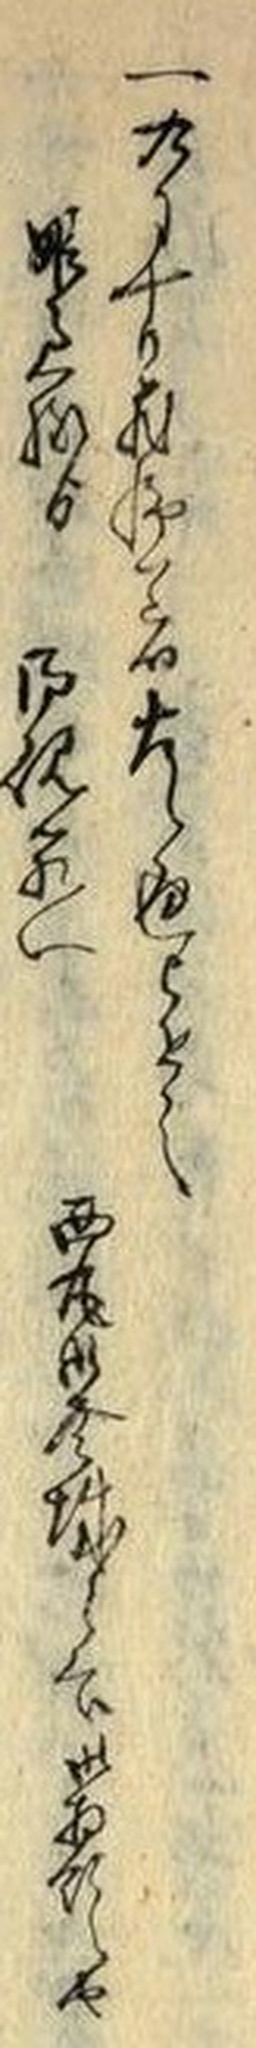姫君様ゟ御硯箱一西丸御登城之節御拝領之由
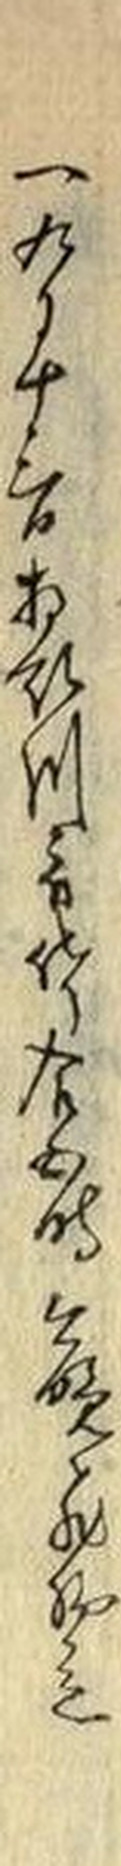一九月十三日拝領段ニ付代り合五時今晩飛脚立
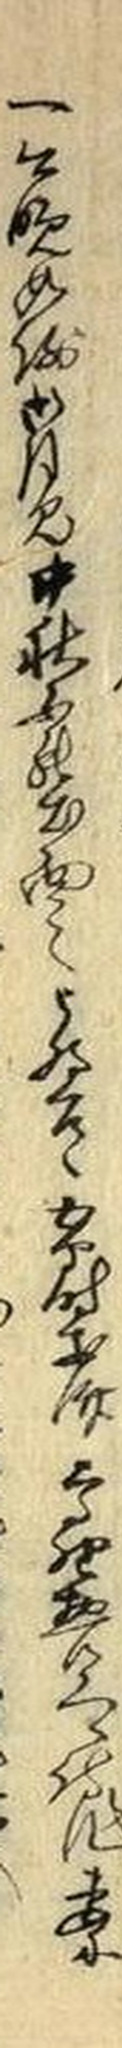一今晩如例御月見中秋不罷出面々被為召候五半時前済高野惣左衛門へ詩作妻木
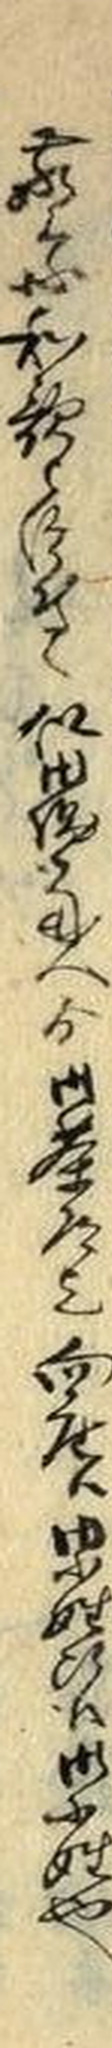敬斎和歌被仰付候但御側御用人ゟ御茶道迄向座ハ御小姓頭取御小姓也
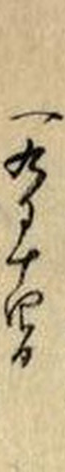一九月十四日
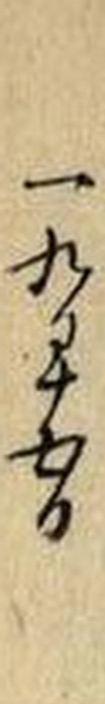一九月十四日
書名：少傅日録抄（斉承付側向頭取日記、在国）
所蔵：福井県文書館 Fukui Prefectural Archives
